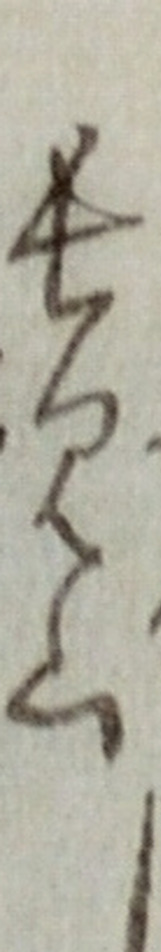長見山

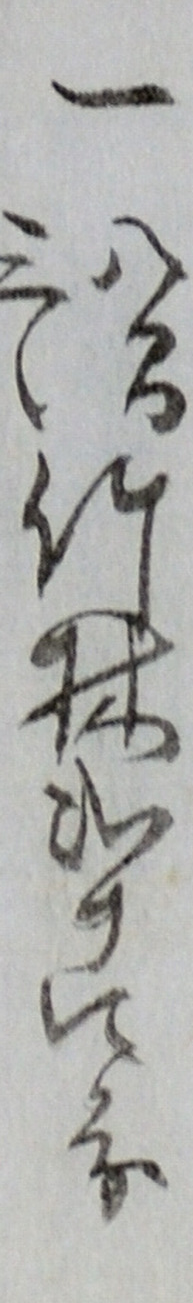一八間竹林二十四歩
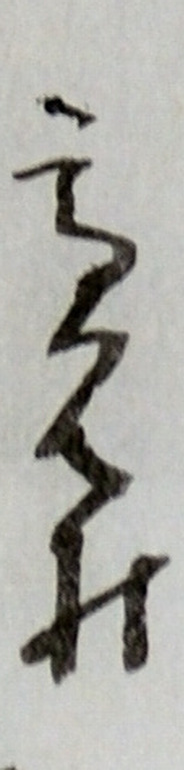高見村
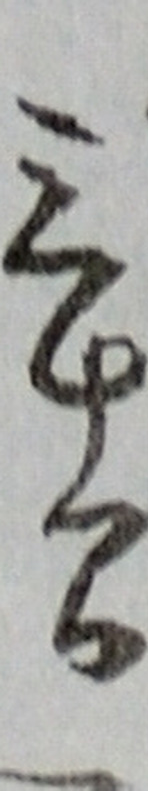三十間
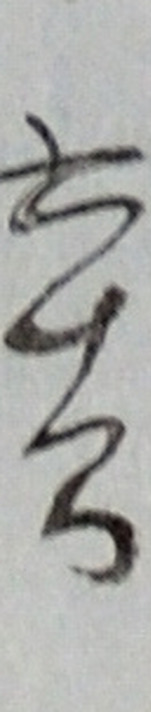六十間
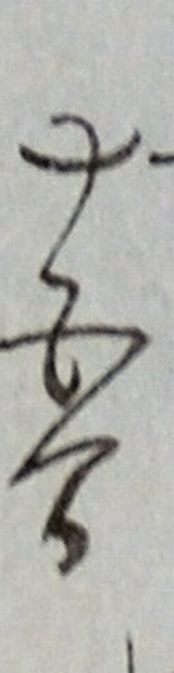十五歩
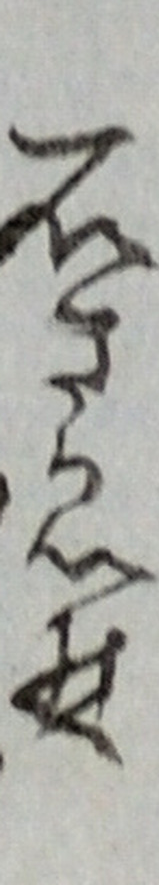石さらい林
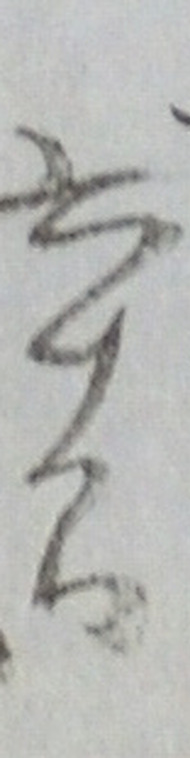六十間
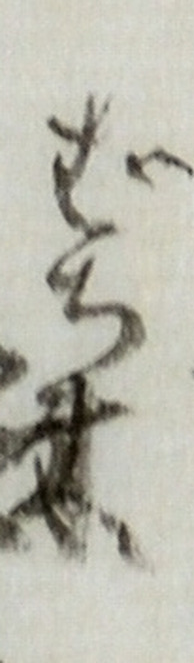ばち熹
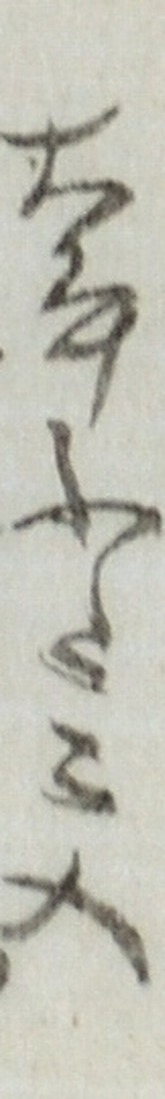大手ふたこ入
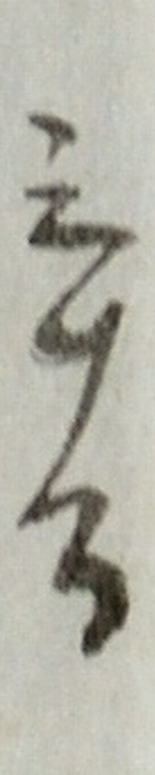三十間
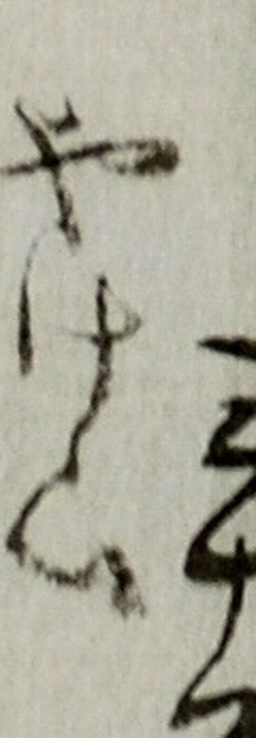やけ山
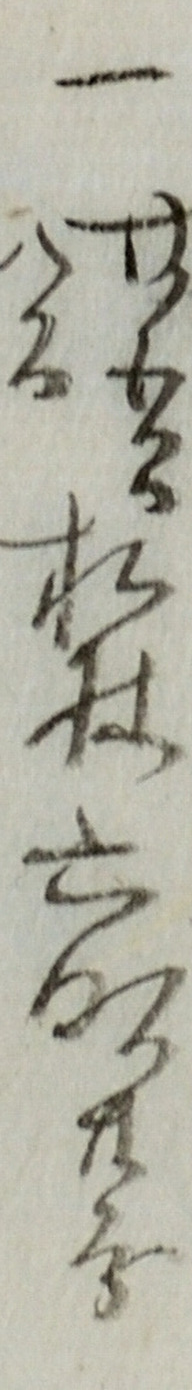一廿五間松林六畝廿歩
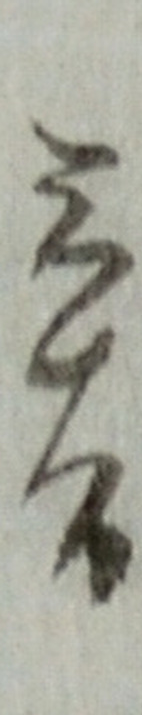三十間

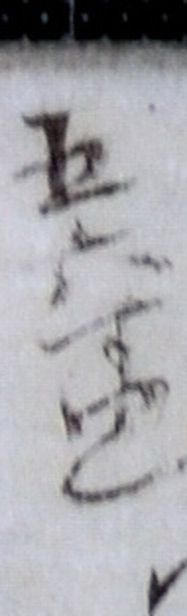五六寸迄
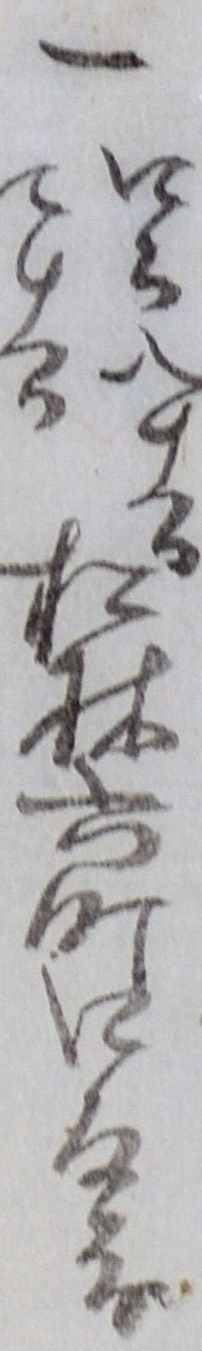一百八十間松林弐町四反歩
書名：中澤郷御林控
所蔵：伊那市立高遠町図書館・合同会社AMANE
